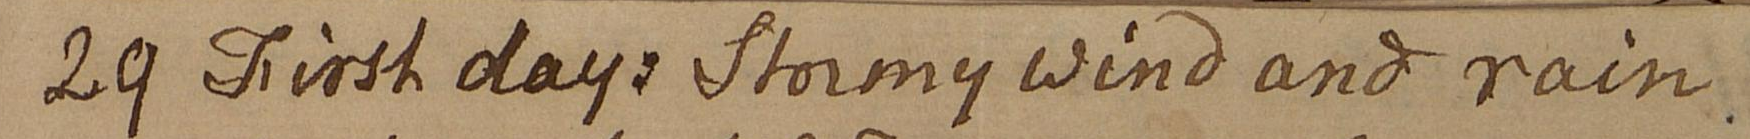29 First day: Stormy wind and rain
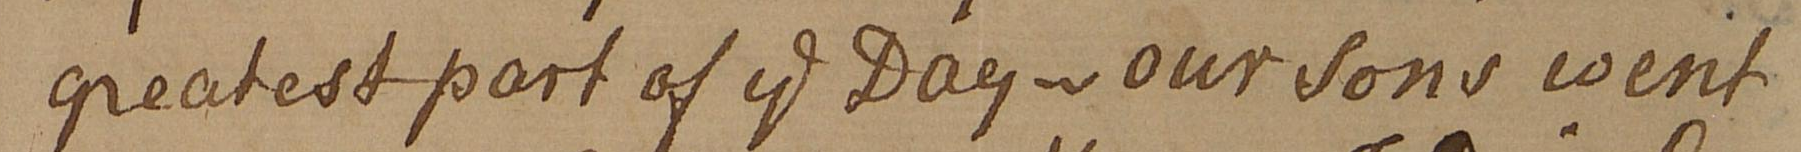greatest part of y^e Day- our Sons went
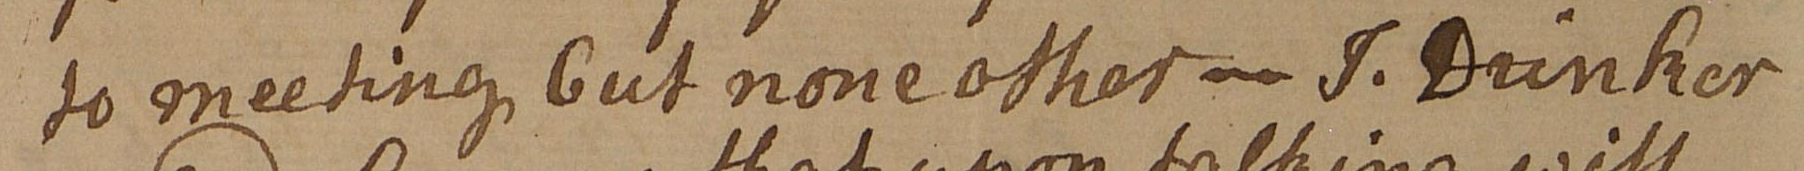to meeting but none other- T. Drinker
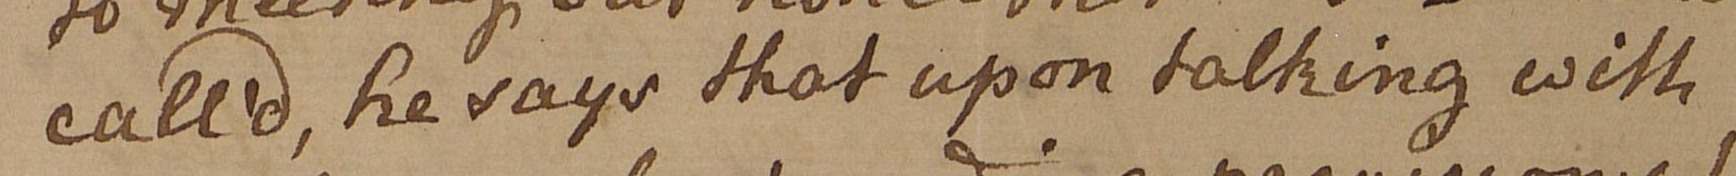call'd, he says that upon talking with
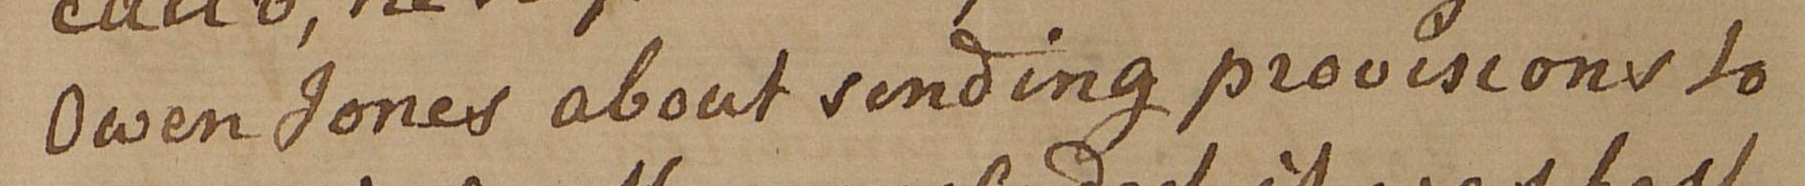Owen Jones about sending provisions to
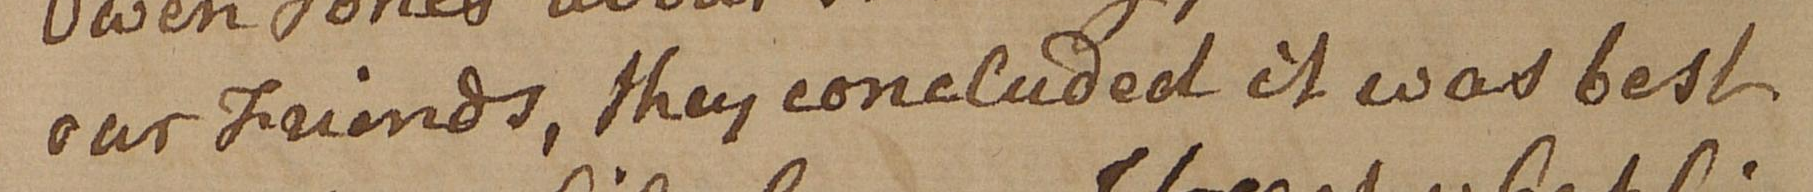our Friends, they concluded it was best
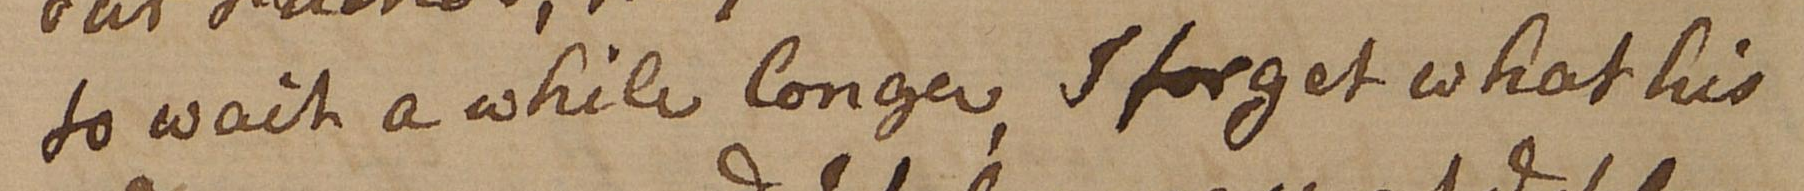to wait a while longer, I forget what his
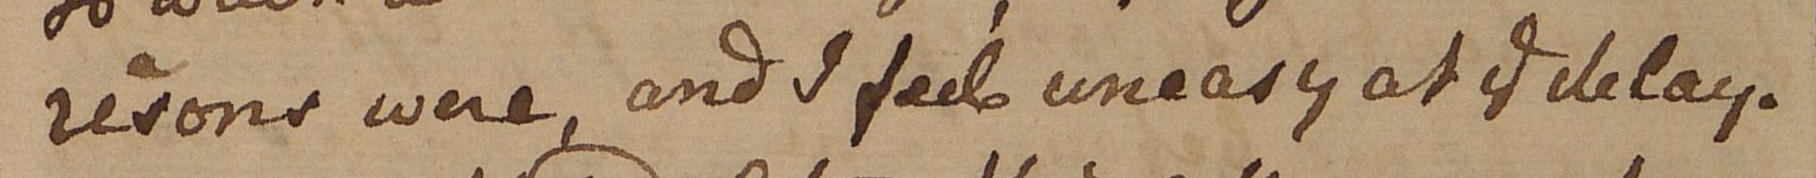resons were, and I feel uneasy at y^e delay.
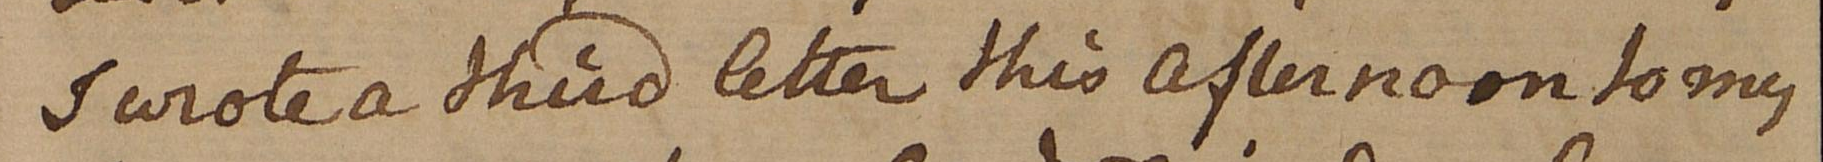I wrote a third letter this afternoon to my
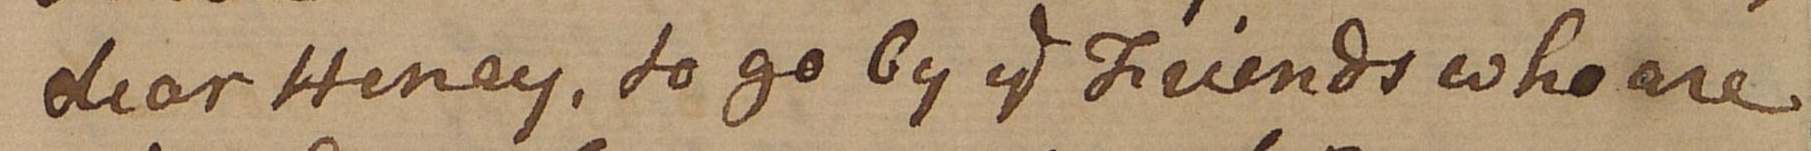dear Henry, to go by y^e Friends who are
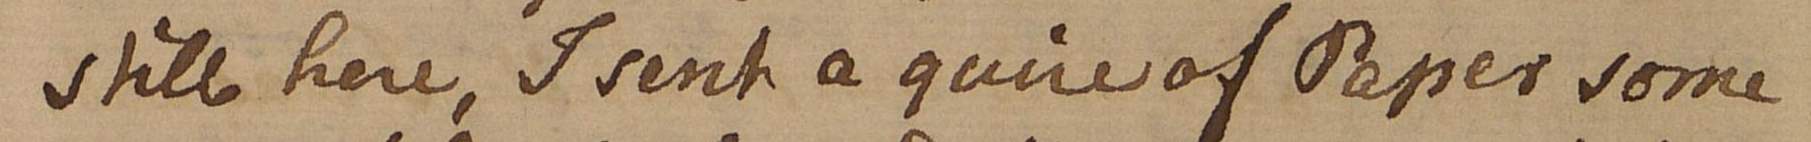still here, I sent a quire of Paper some
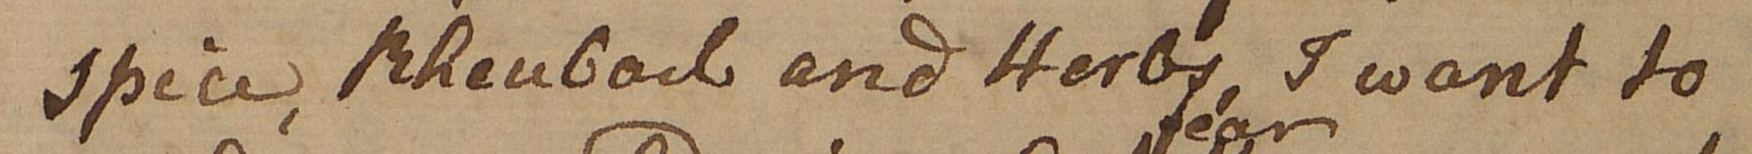spice, Rheubarb and Herbs, I want to
